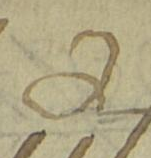a
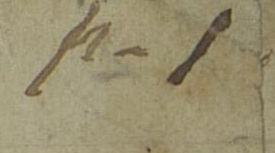p. 1
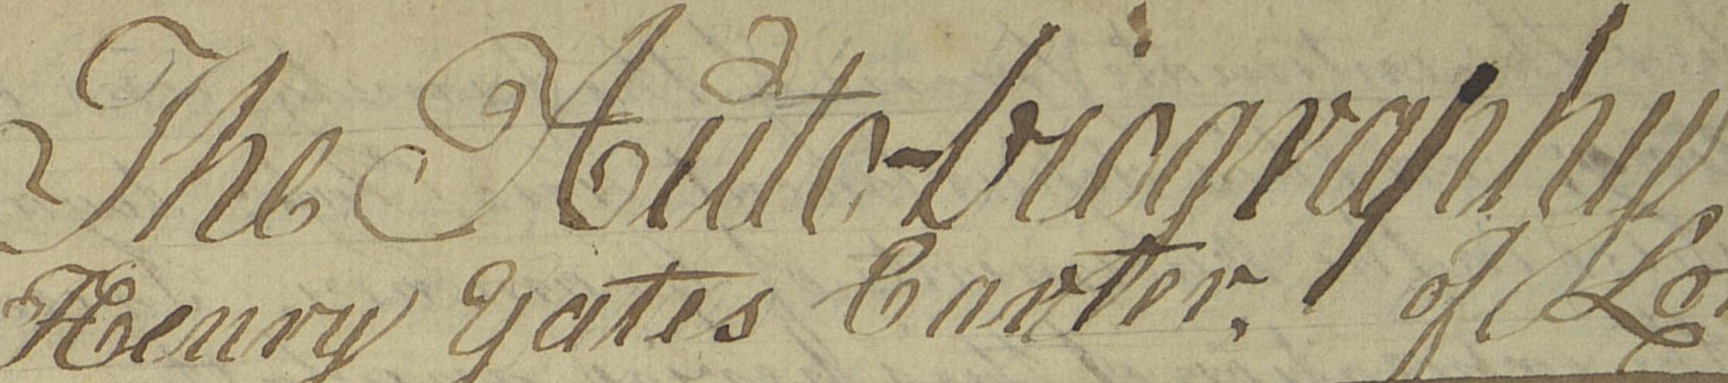The Auto-biography
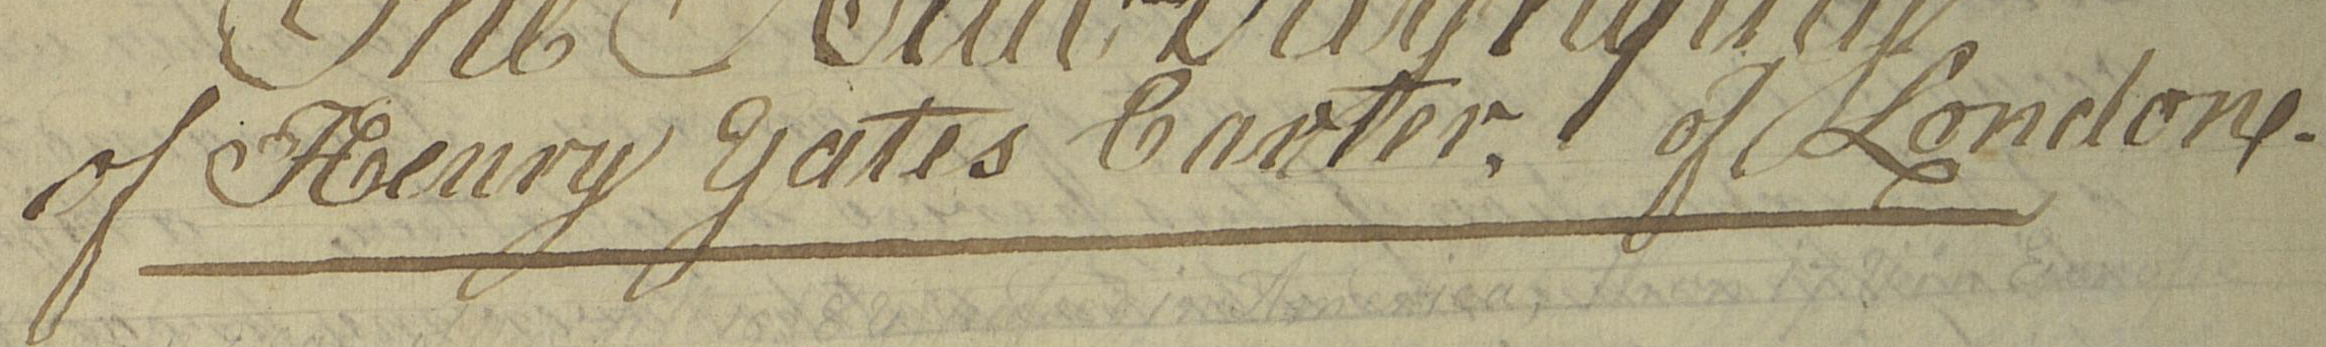of Henry Yates Carter, of London
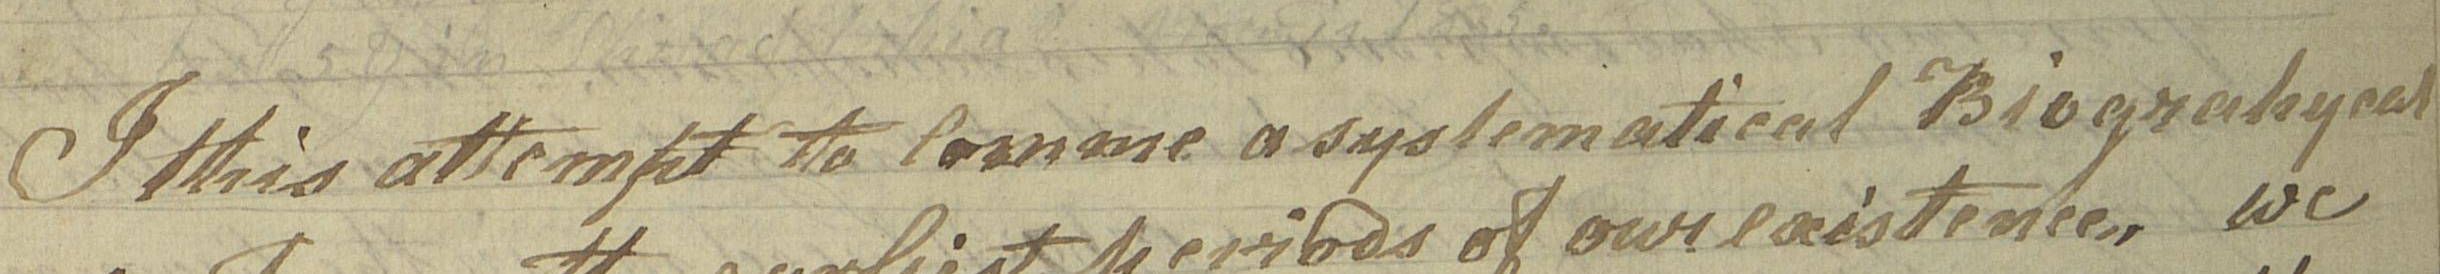I this attempt to Camme a systematical Biograhycal
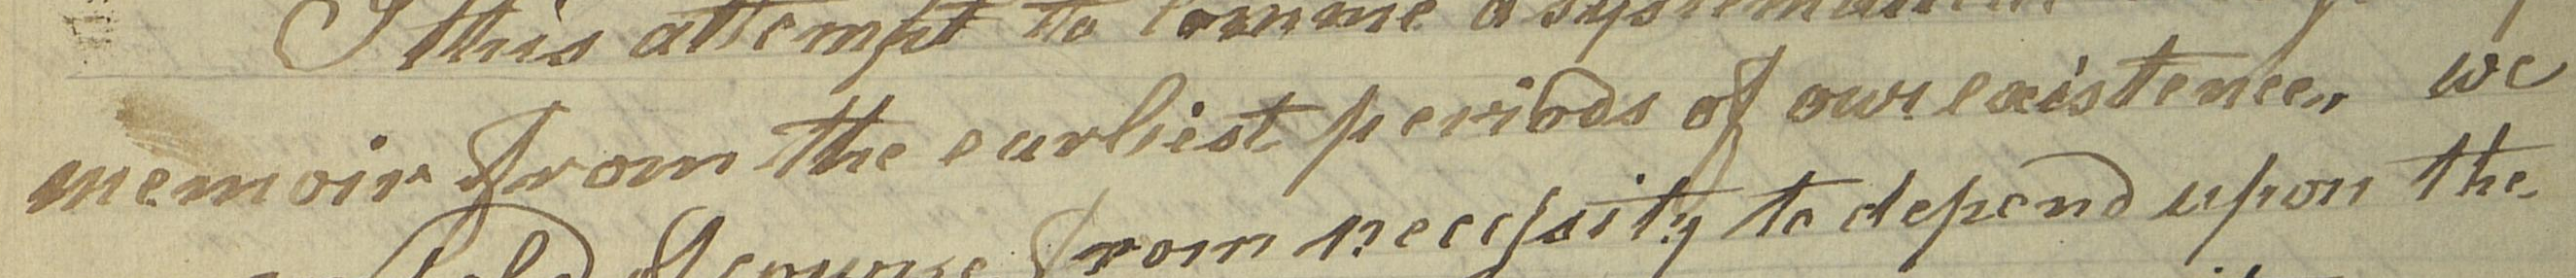memoir from the earliest periods of our existence, we
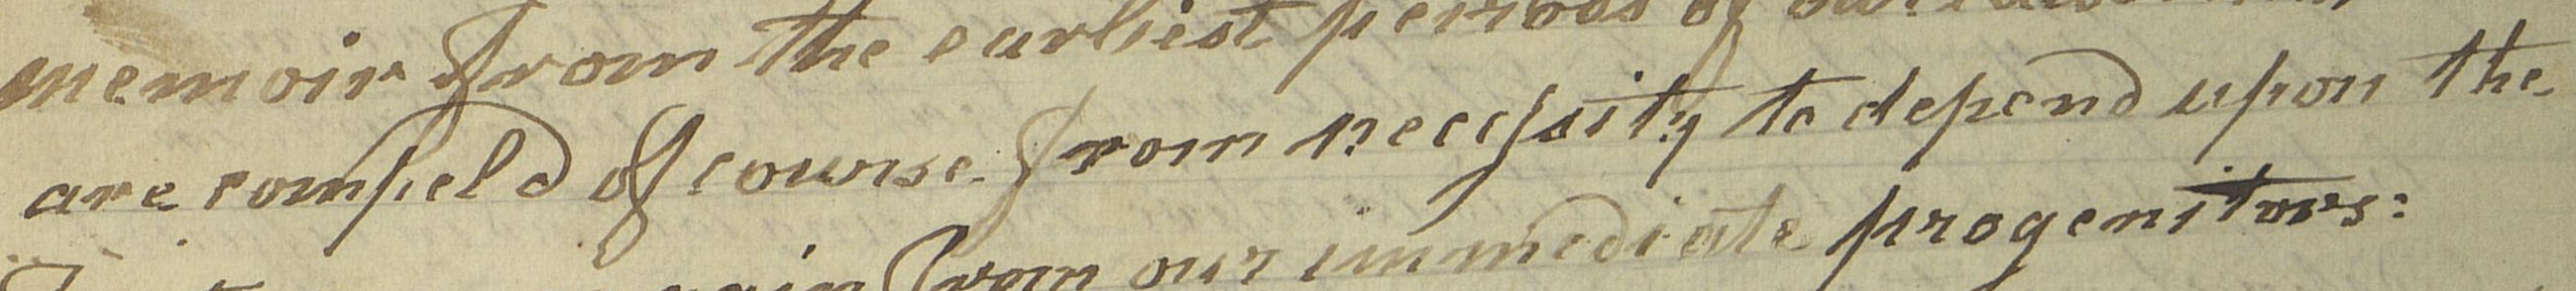are compeld of course from necessity to depend upon the
